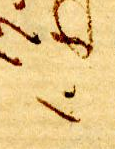1.8
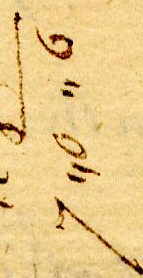7 ..0 ..6
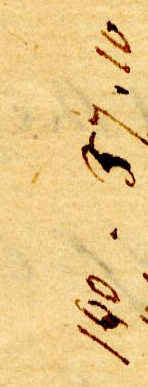100 . 37.10
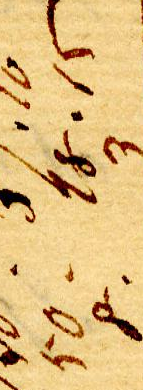50. 18.15
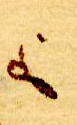8.
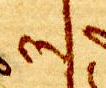3
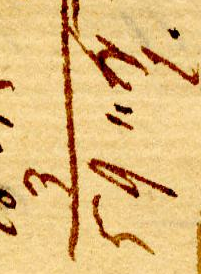59 .. 5
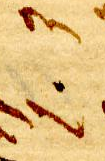1.3
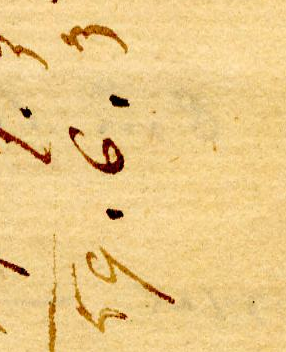59.6.3
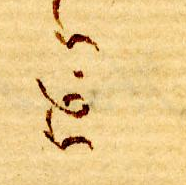56.5
